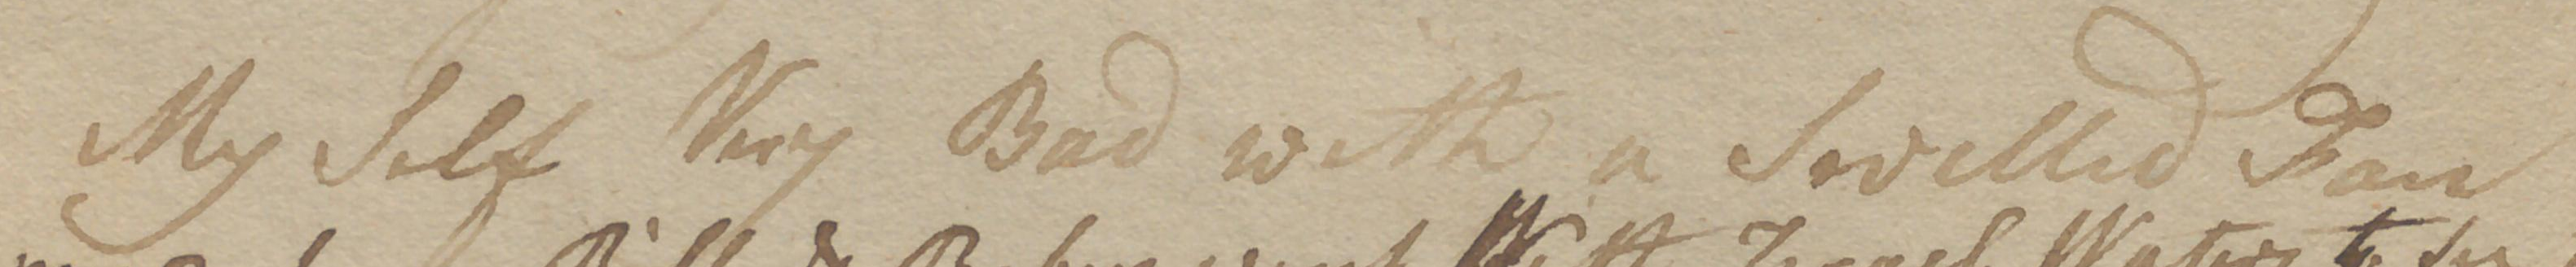My Clt Viryg Bad we Sevelled Fan
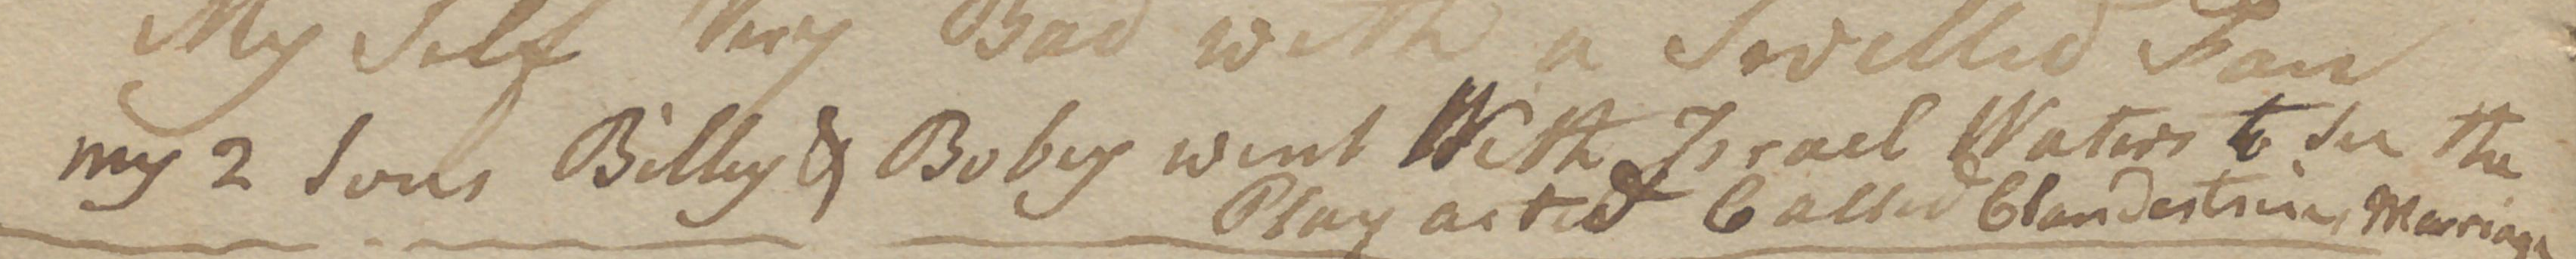my 2 Sons Billey & Bobey went With Israel Waters to see the
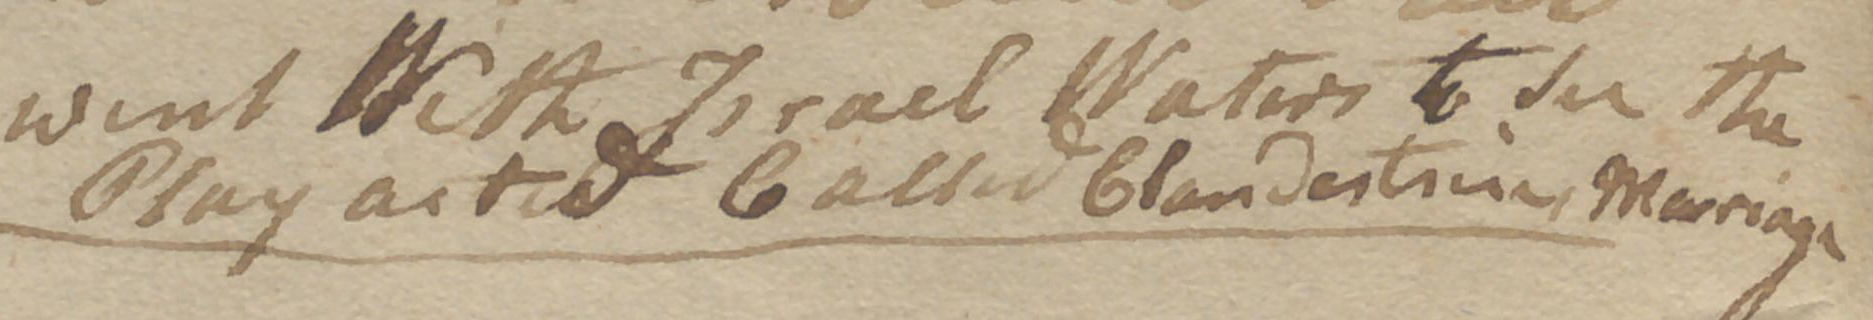Play acted Called Clandestine Marriage
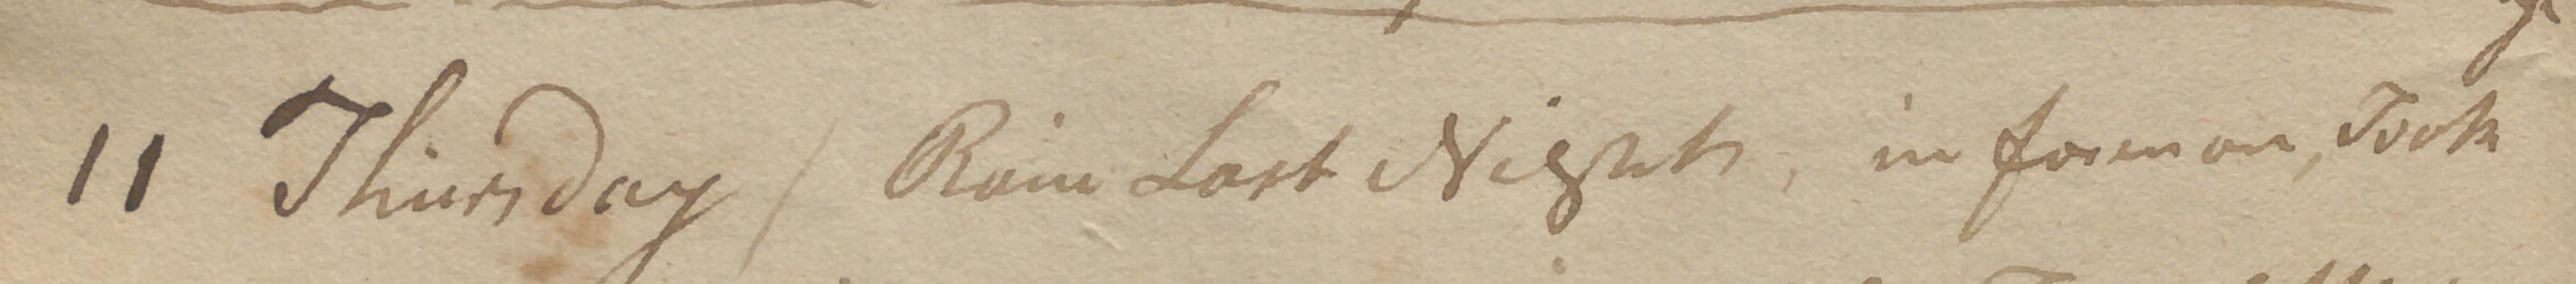11 Thursday, Rain Last Night, in forenon, Took
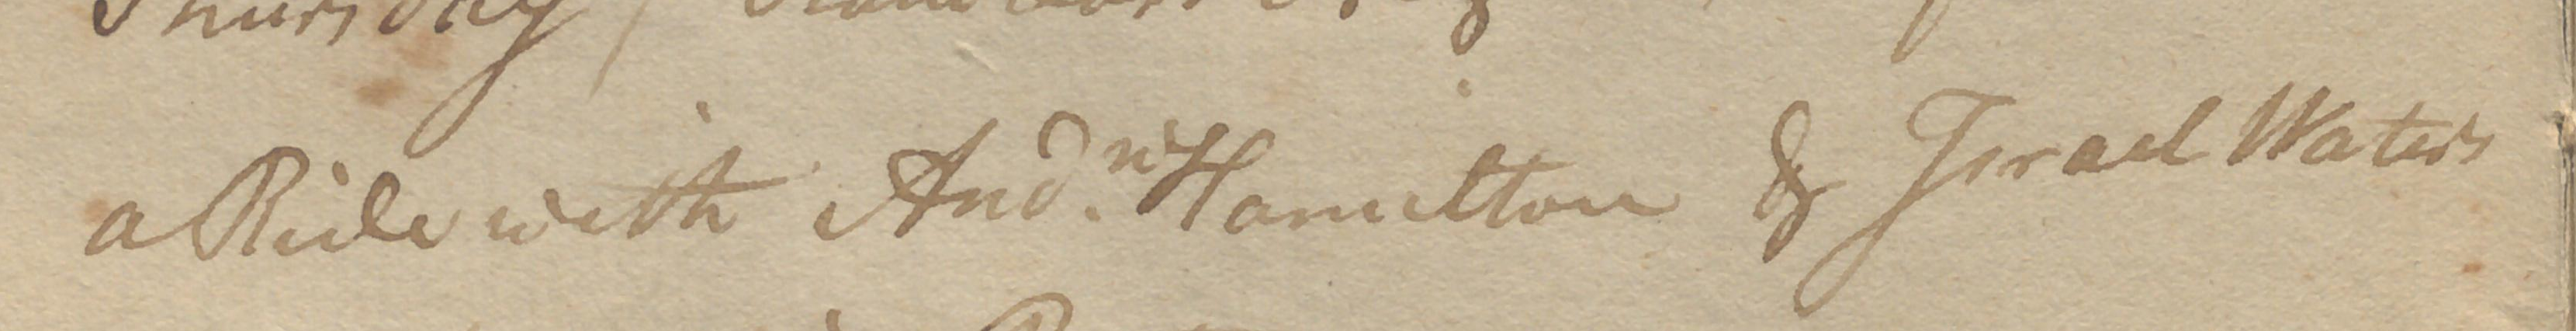a Ride with And^r. Hamilton & Israel Waters
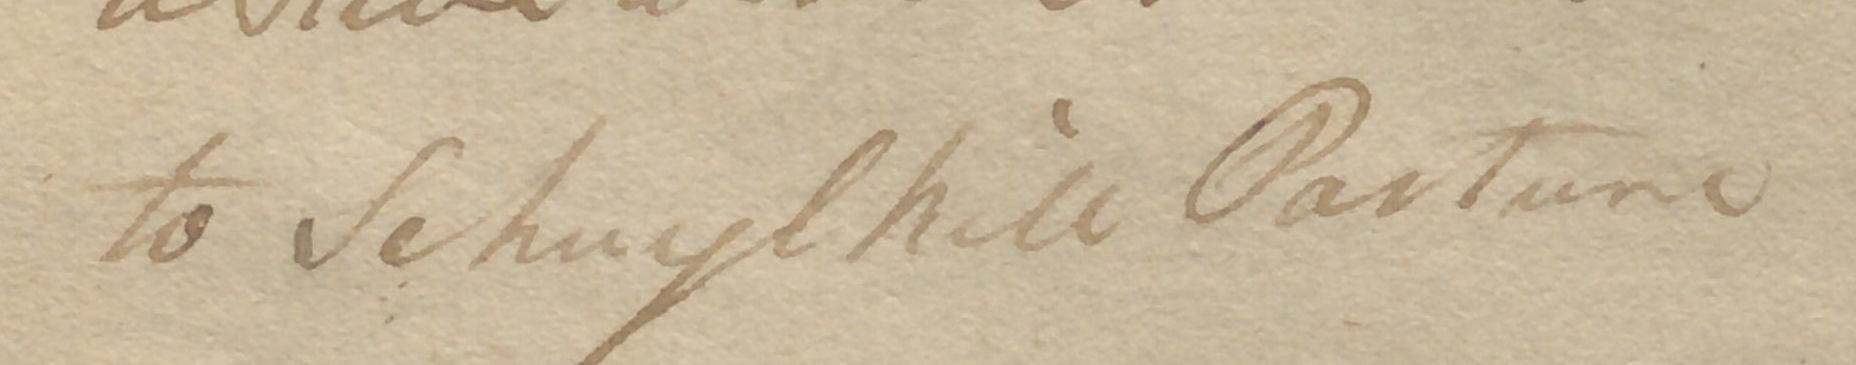to Schuylkill Pasture
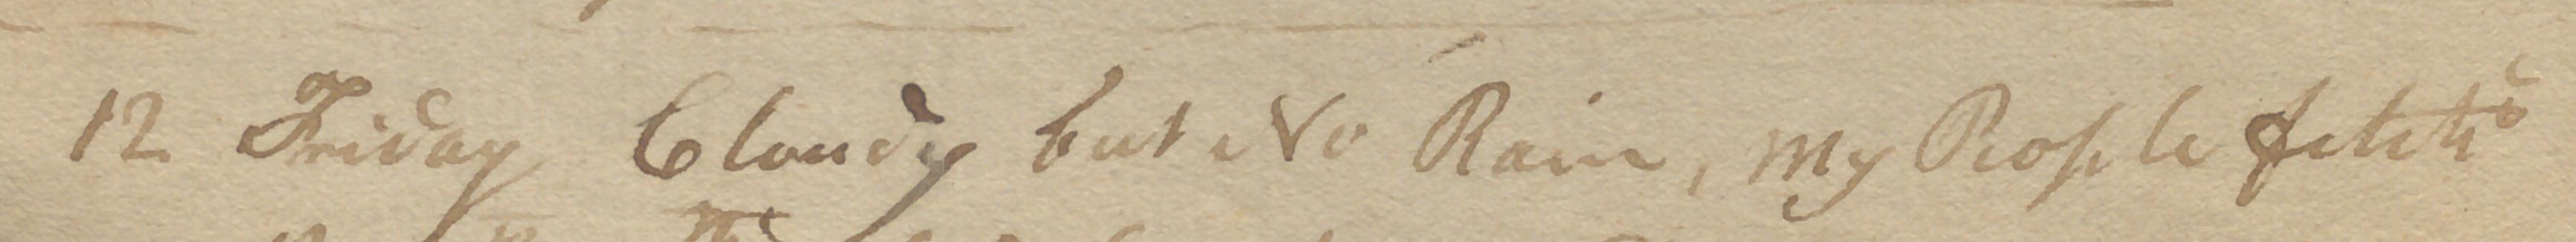12 Friday Cloudy but No Rain, My People fetch^d
